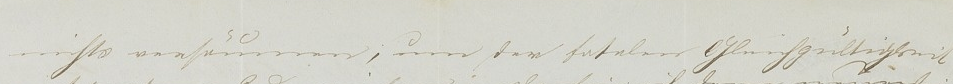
nichts versäumen, um der fatalen Gleichgültigkeit
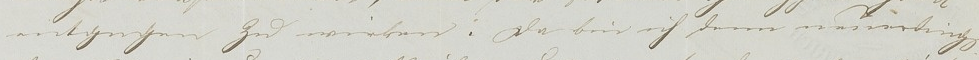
entgegen zu wirken. Da bin ich denn neuerdings
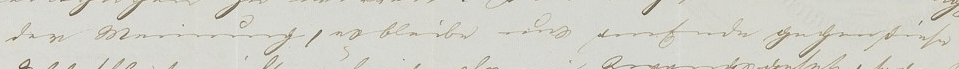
der Meinung, es bleibe uns am Ende gegen diese
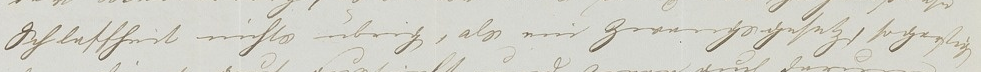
Schlaffheit nichts übrig, als ein Zwangsgesetz, so garstig
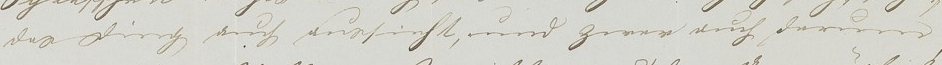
das Ding auch aussieht, und zwar auch darum,
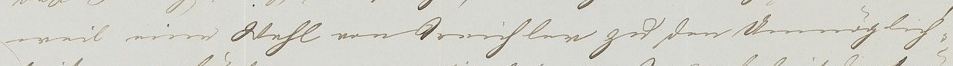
weil eine Wahl von Treichler zu den Unmöglich-
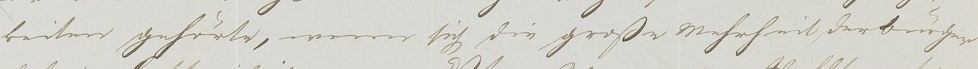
keiten gehörte, wenn sich die große Mehrheit der Bürger
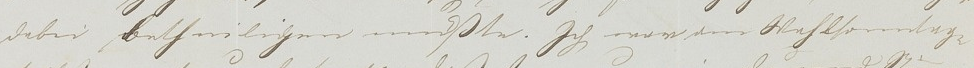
dabei betheiligen müßte. Ich war am Wahlsonntage
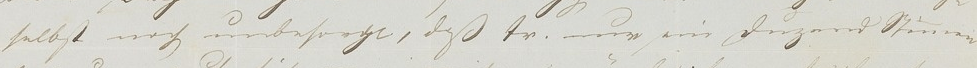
selbst noch unbesorgt, daß Tr. nur ein Duzend Stimmen
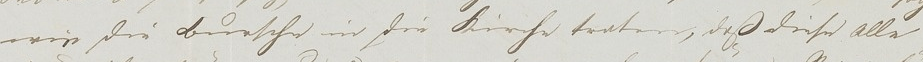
wie die Bursche in die Kirche traten, daß diese Alle
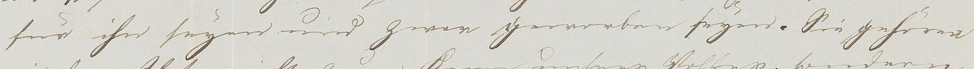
für ihn seyen und zwar geworben seyen. Sie gehören
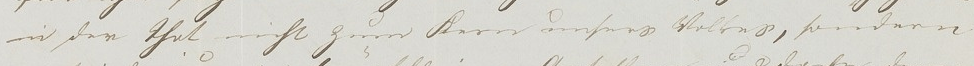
in der That nicht zum Kern unsers Volkes, sondern
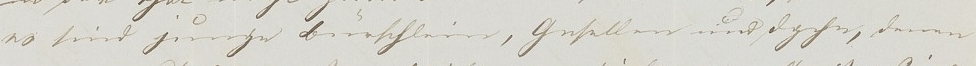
es sind junge Bürschlein, Gesellen und dgchn, denen
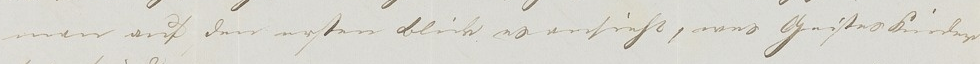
man auf den ersten Blick es ansieht, wes Geistes Kinder
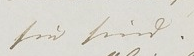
sie sind.
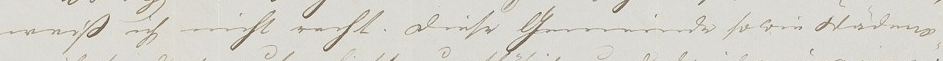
weiß ich nicht recht. Diese Gemeinde sowie Wädens-
